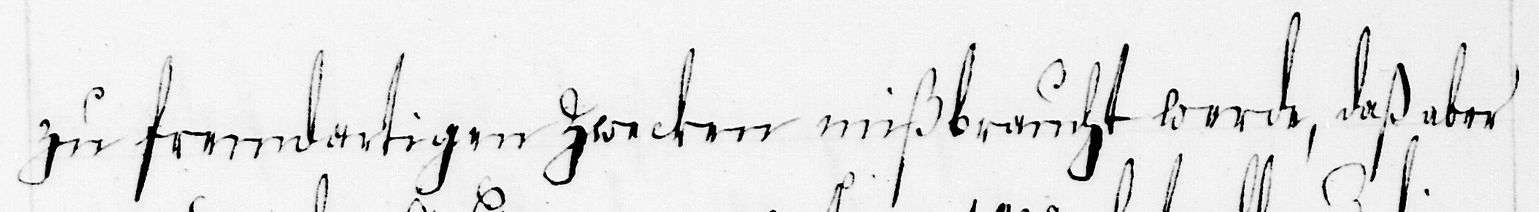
zu fremdartigen Zwecken mißbraucht werde, daß aber
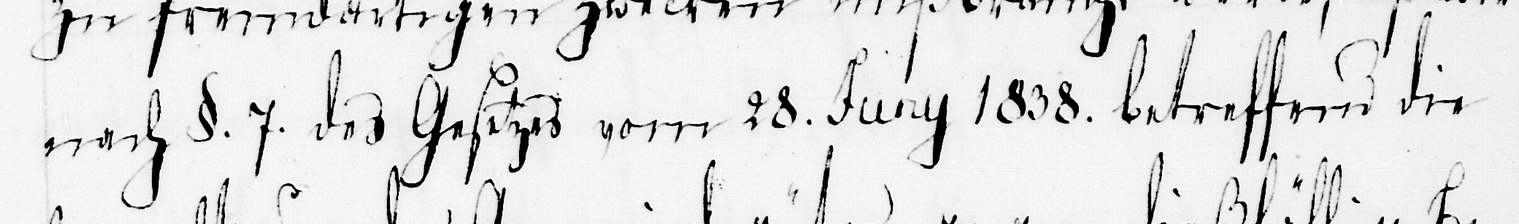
nach §. 7. des Gesetzes vom 28. Juny 1838. betreffend die
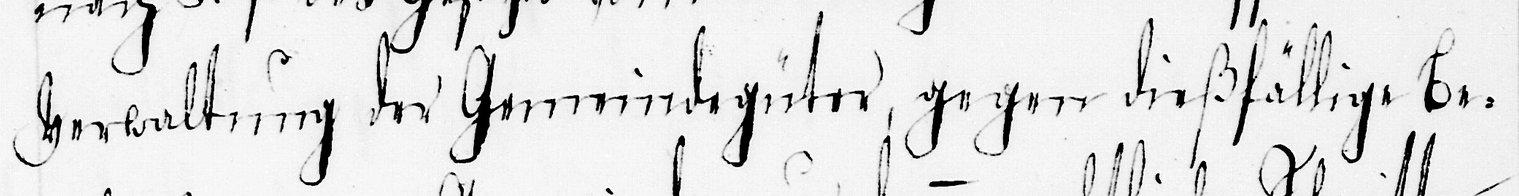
Verwaltung der Gemeindegüter, gegen dießfällige Be¬
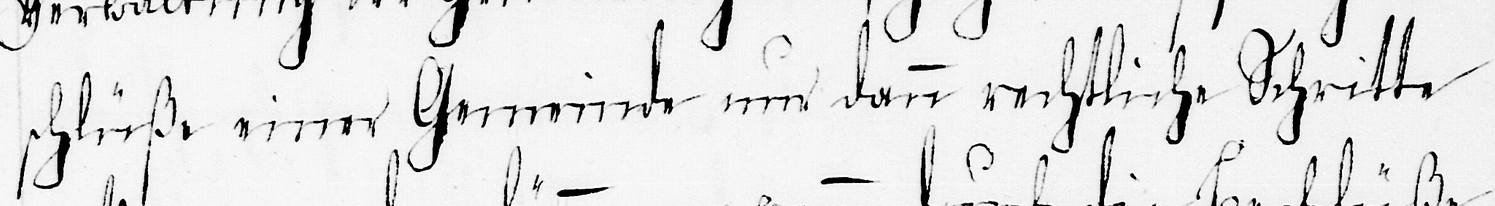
schlüße einer Gemeinde nur dann rechtliche Schritte
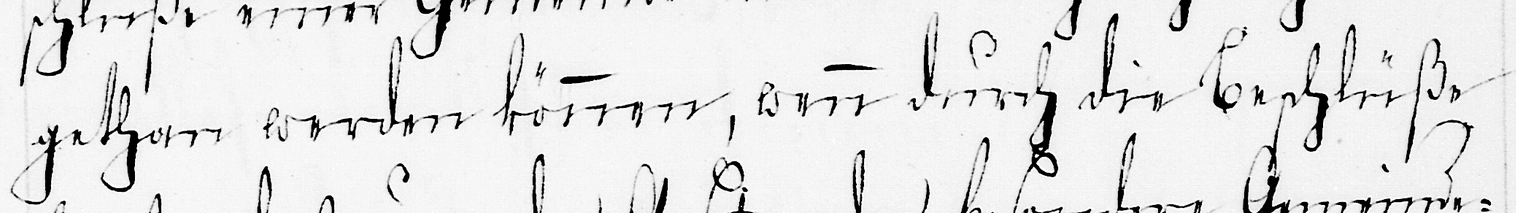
gethan werden können, wenn durch die Beschlüße
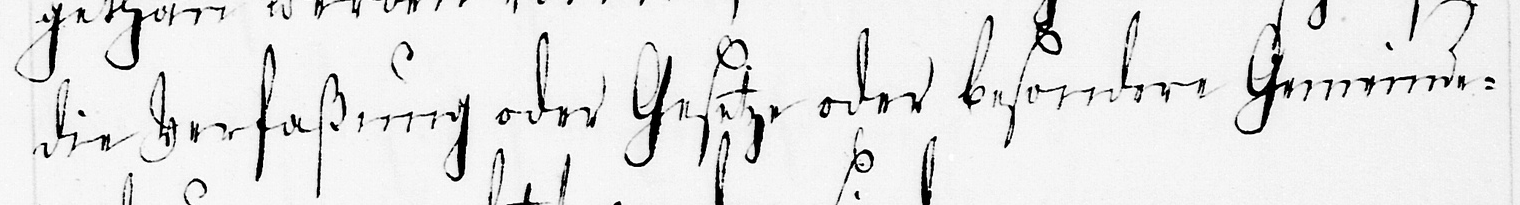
die Verfaßung oder Gesetze oder besondere Gemeinde¬
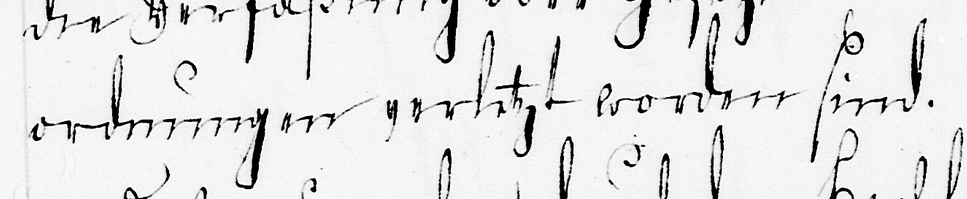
ordnungen verletzt worden sind.
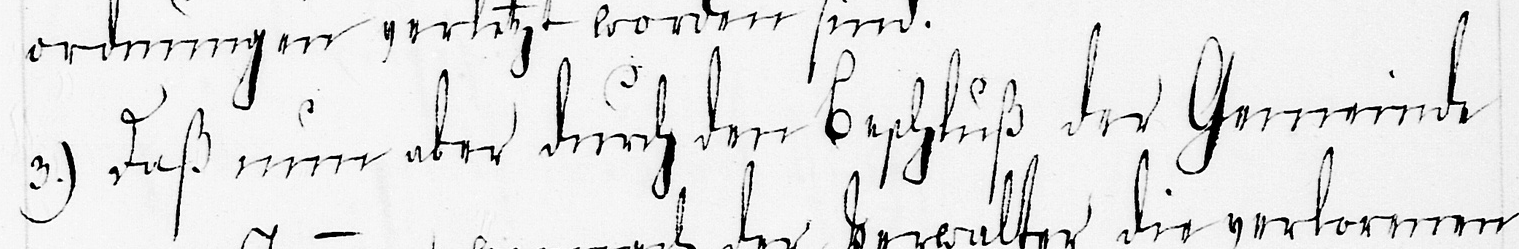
3.) Daß nun aber durch den Beschluß der Gemeinde
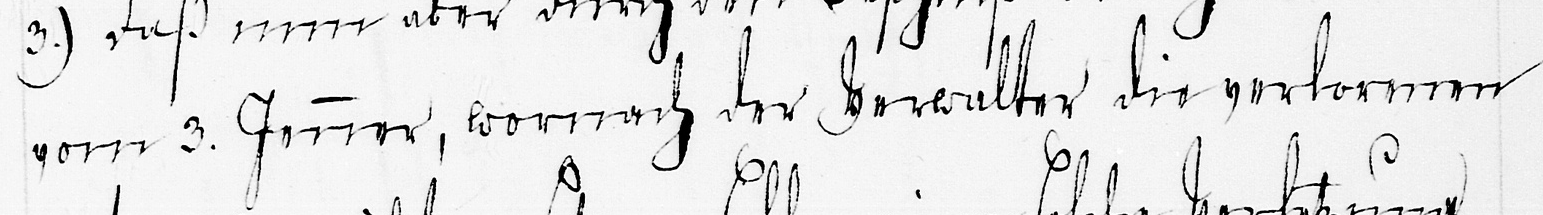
vom 3. Jenner, wornach der Verwalter die verlorenen
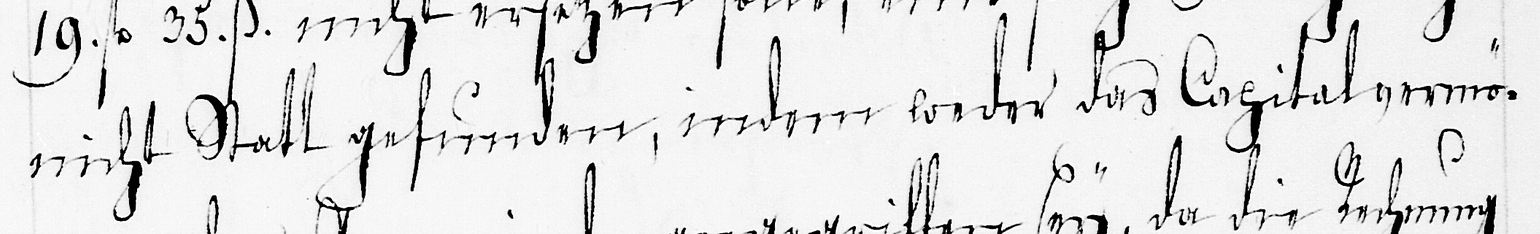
nicht Statt gefunden, indem weder das Capitalvermö¬
